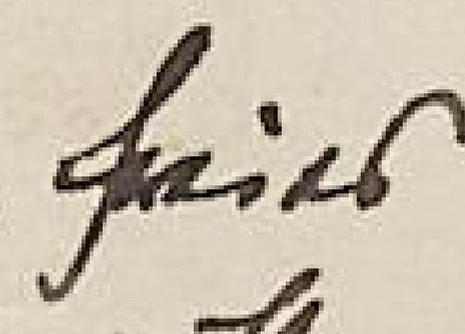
freies
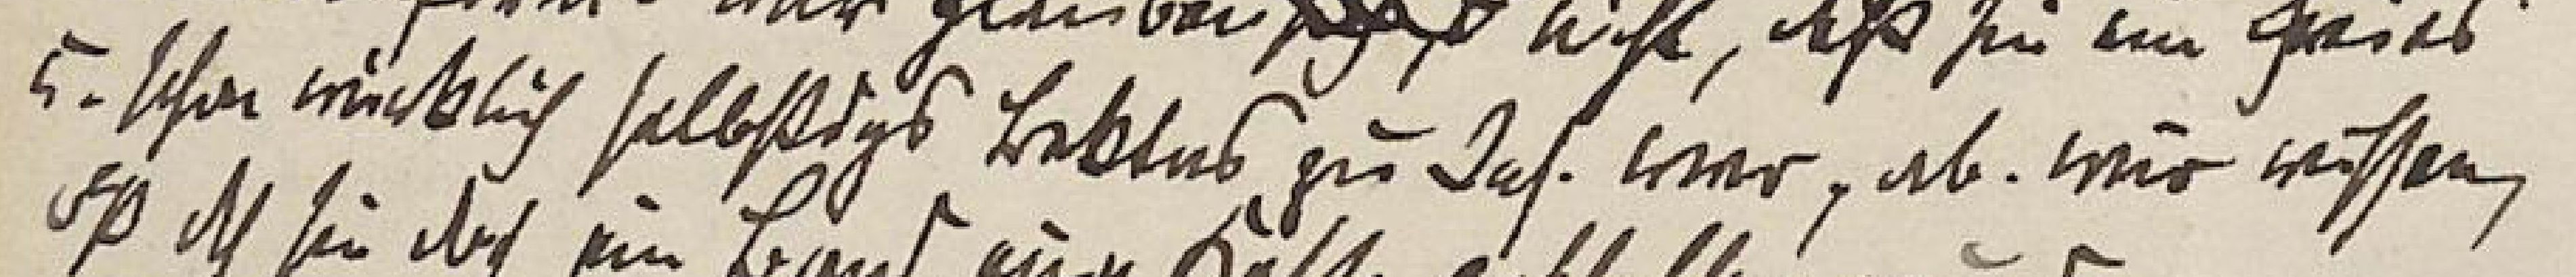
u. schon wirklich selbstdgs Bektns zu Jes. war, ab. wir wissen,
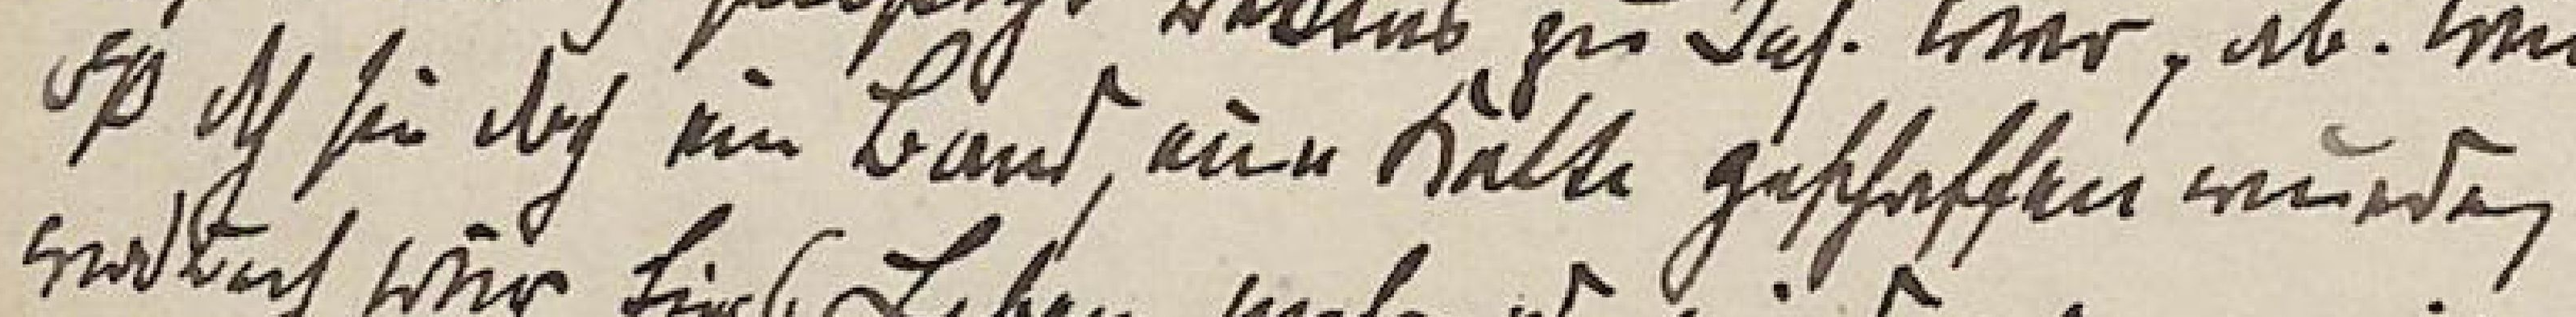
dß dch sie doch ein Band, eine Kette geschaffen wurde,
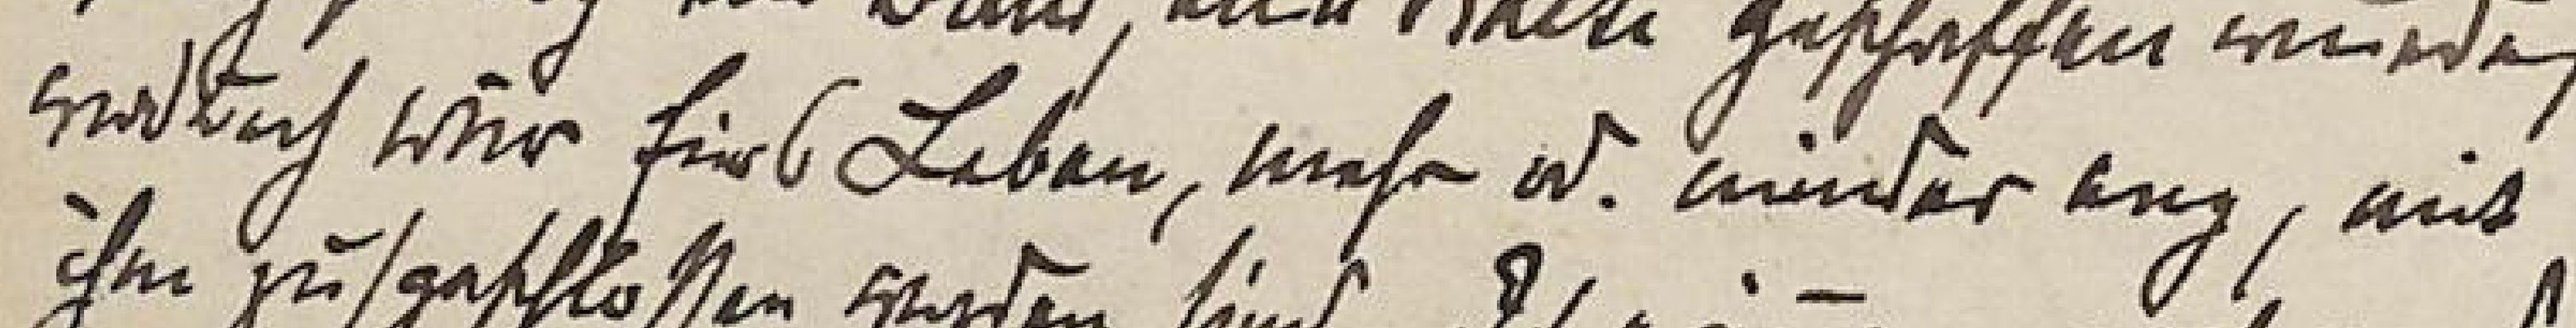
wodruch wir fürs Leben, mehr od. minder eng, mit
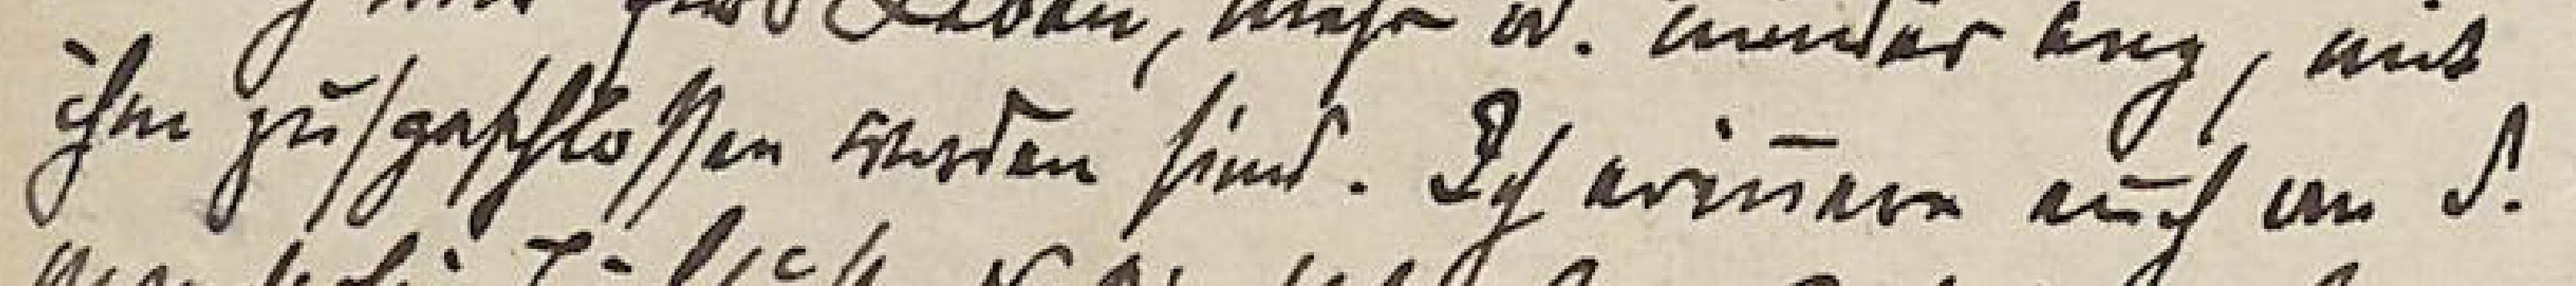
uhm zusgeschlossen worden sind. Ich erinere euch an d.
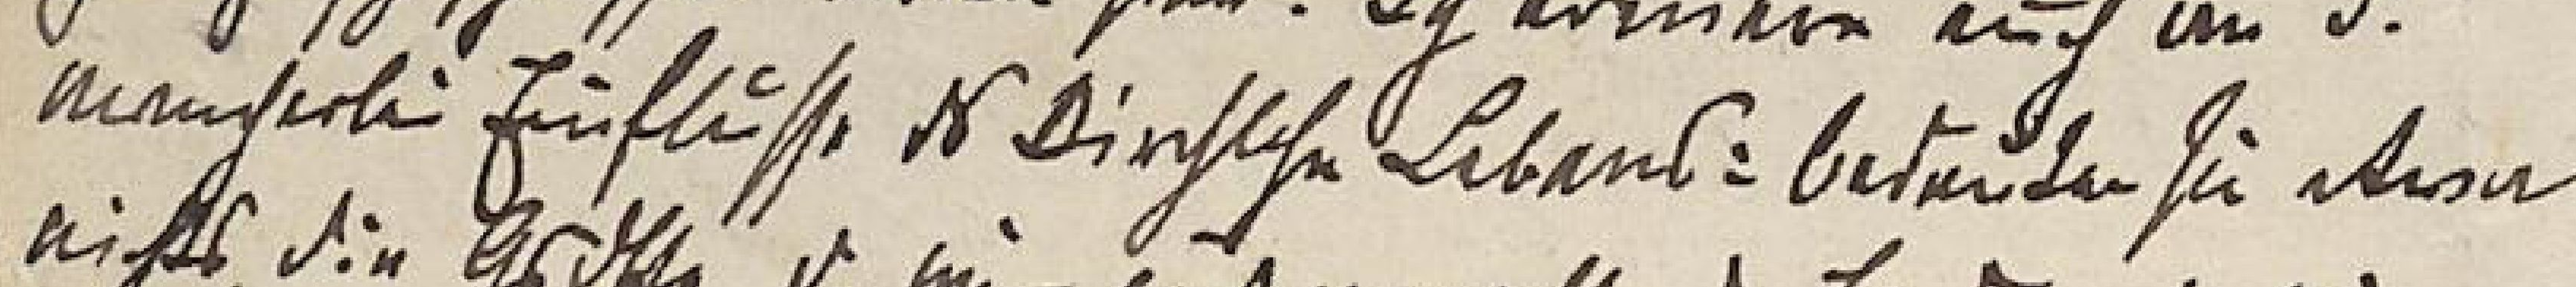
mancherlei Einflüsse ds. kirchlchn Lebens: bedeuten sie etwa
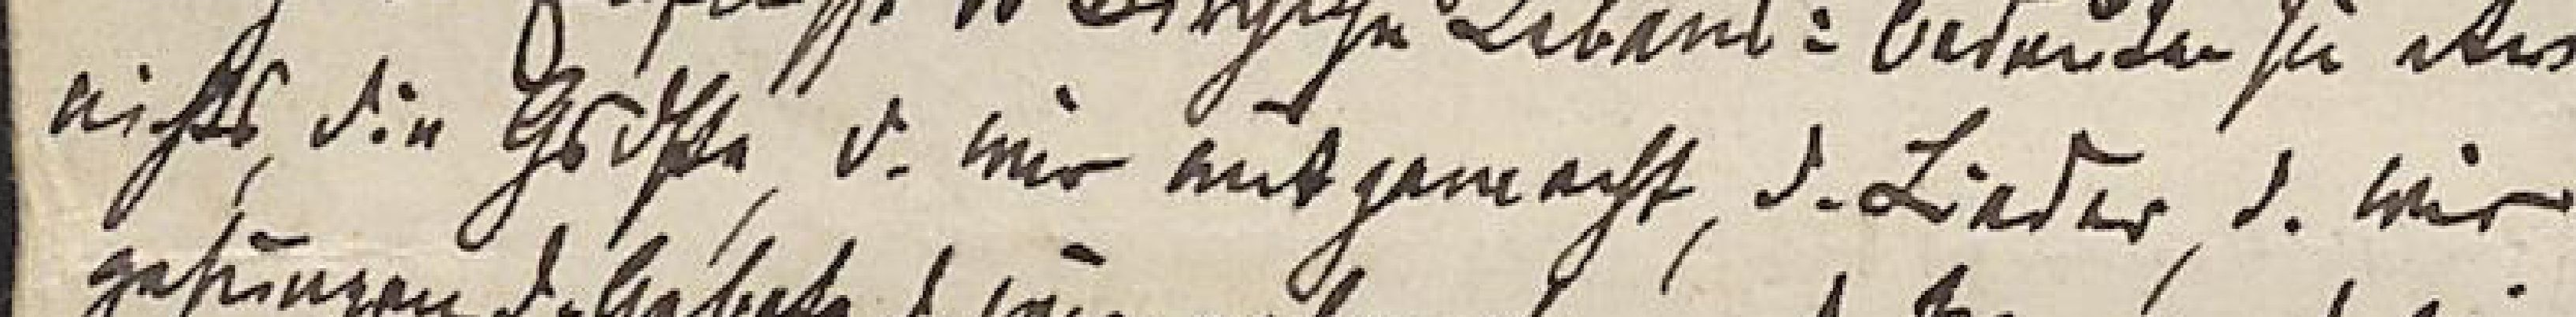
nichts, die Gsdste, d. wir mitgemacht, d. Lieder, d. wir
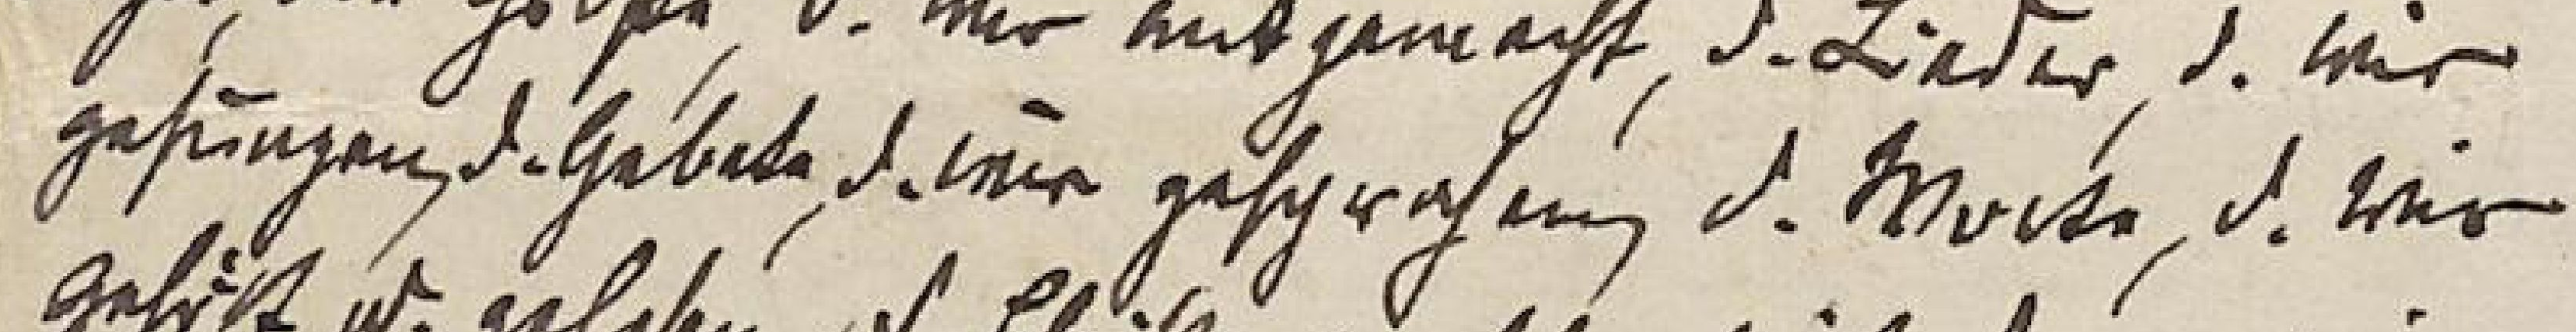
gesungen, d. Gebete, d. wir gesprochen, d. Worte, d. wir
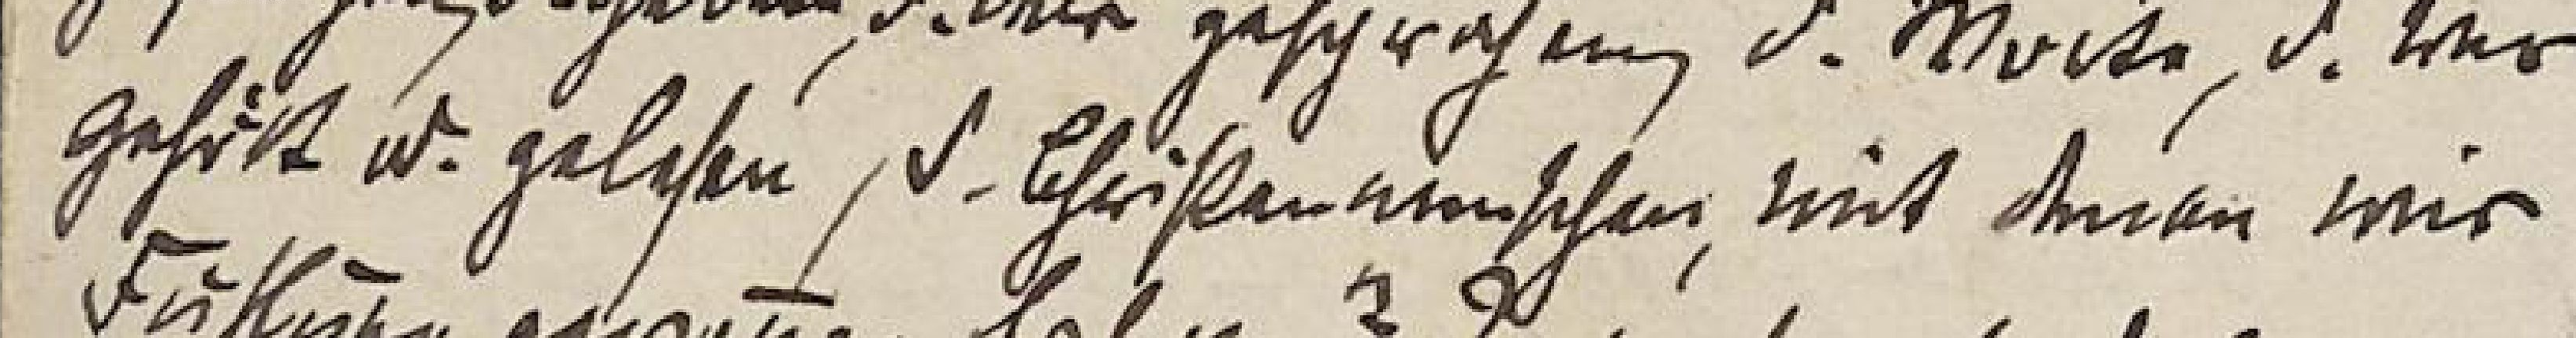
gehört od. gelesen, d. Christenmenschen, mit denen wir
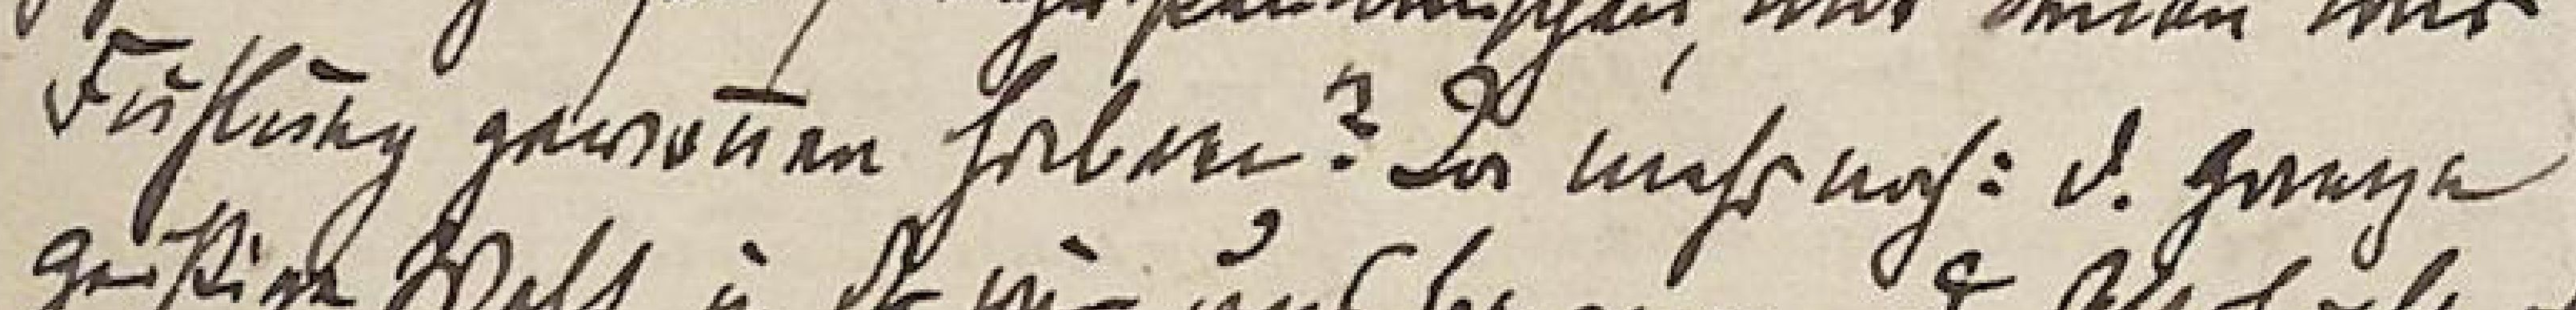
Fühlung gewonen haben? Ja mehr noch: d. ganze
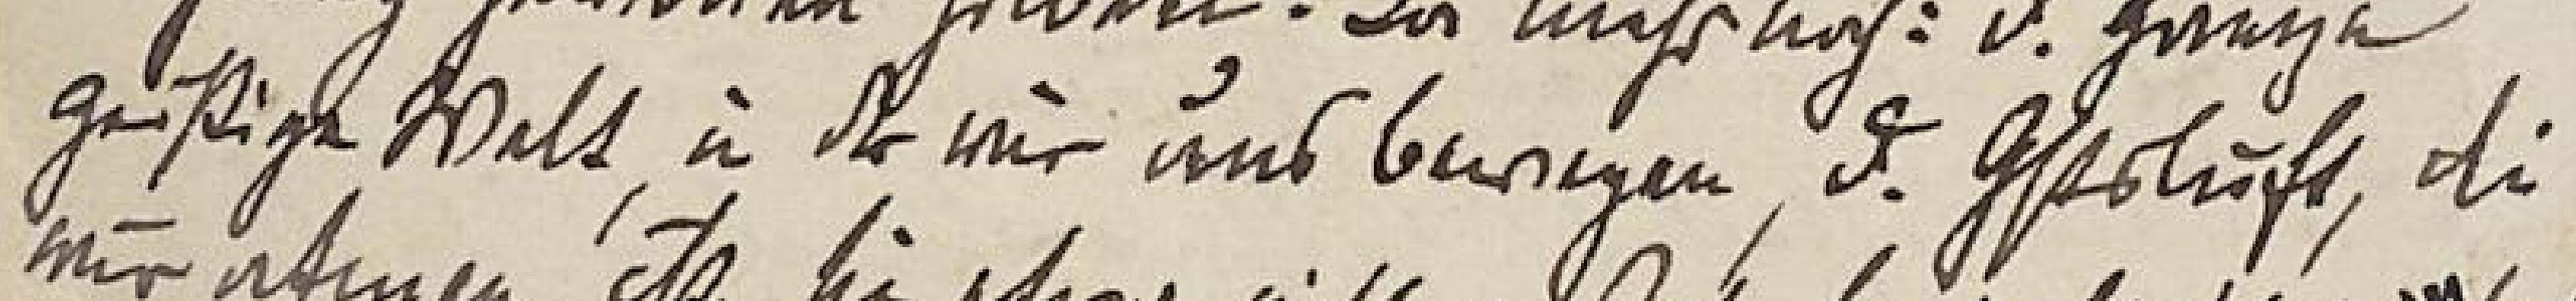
geistige Welt, in dr wir uns bewegen, d. Gstsluft, die
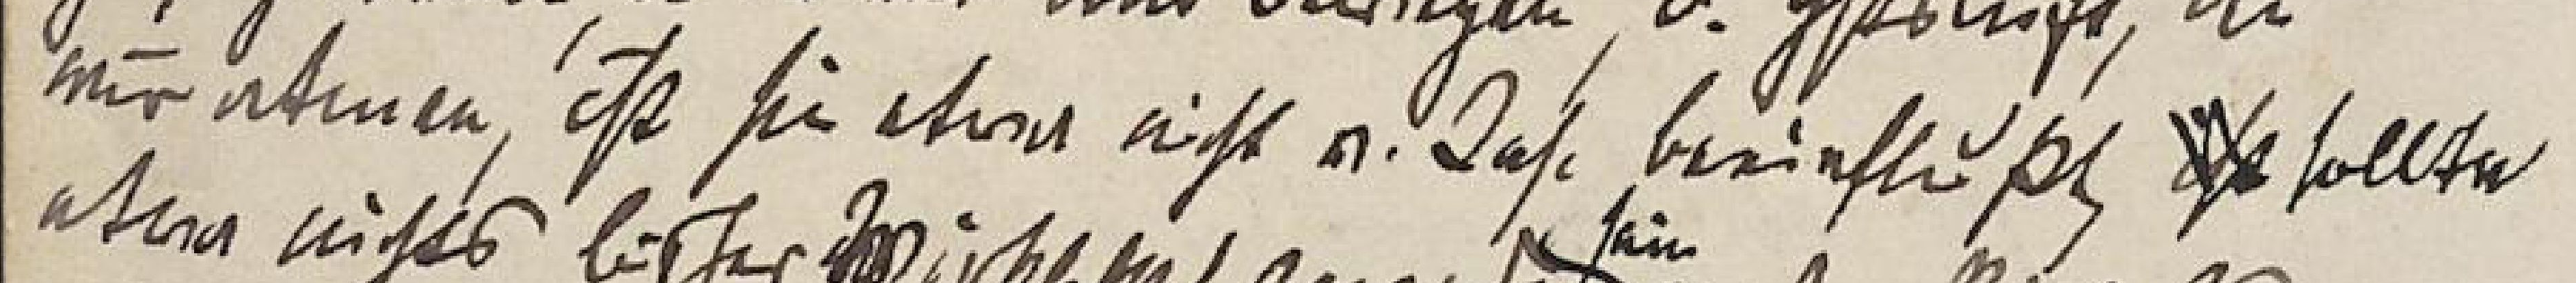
wir atmen, ist sie etwa nicht v. Jes. beeinflußt, ist sollte
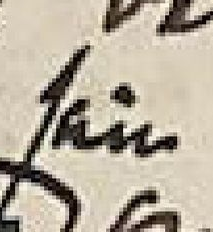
sein
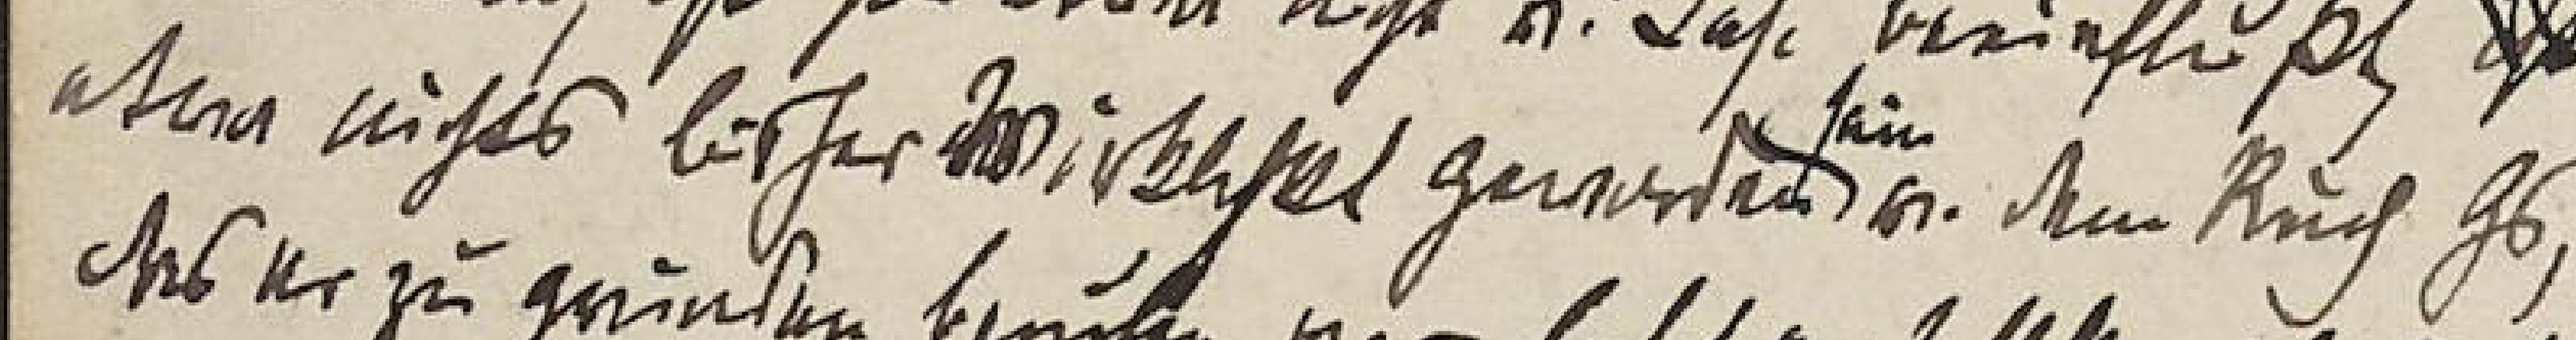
etwa nichts bisher Wirklichkt geworden v. Reich Gs,
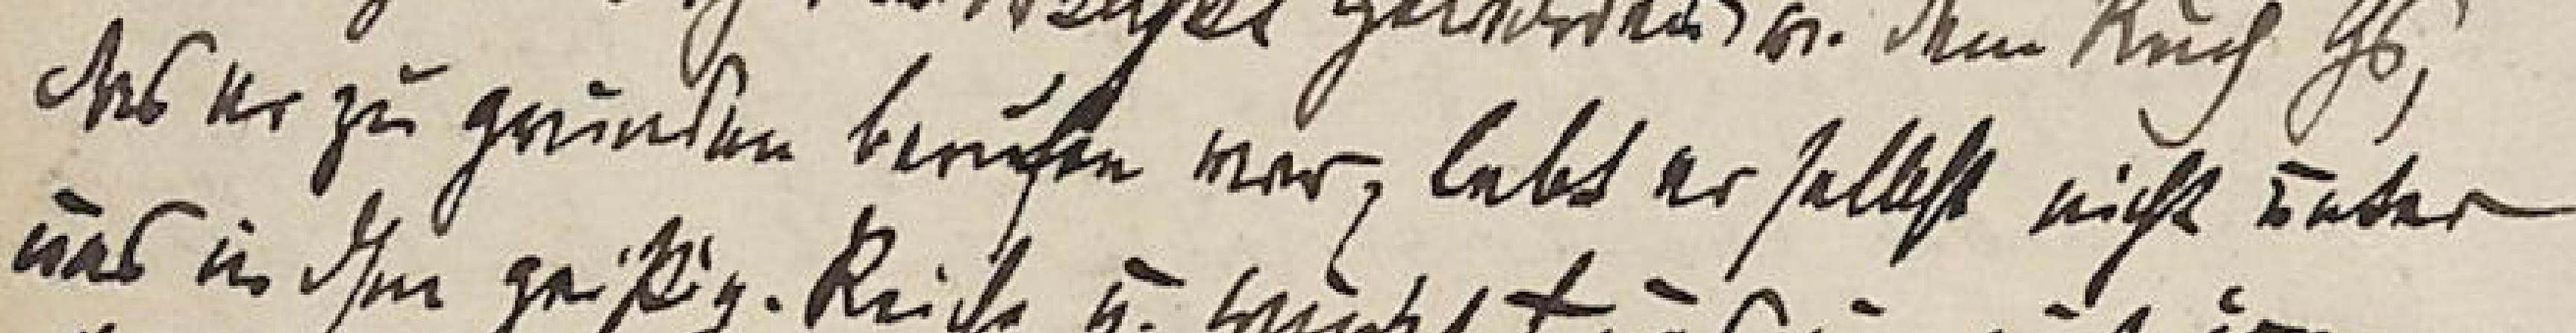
das er zu gründen berufen war, lebt er selbst nicht unter
